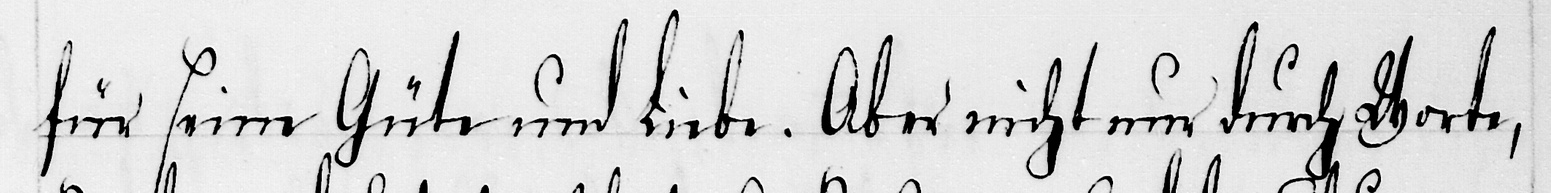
für seine Güte und Liebe. Aber nicht nur durch Wort¬
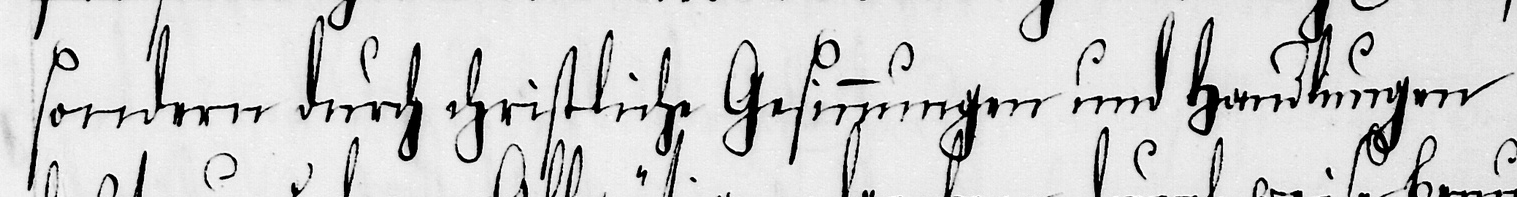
sondern durch christliche Gesinnungen und Handlungen
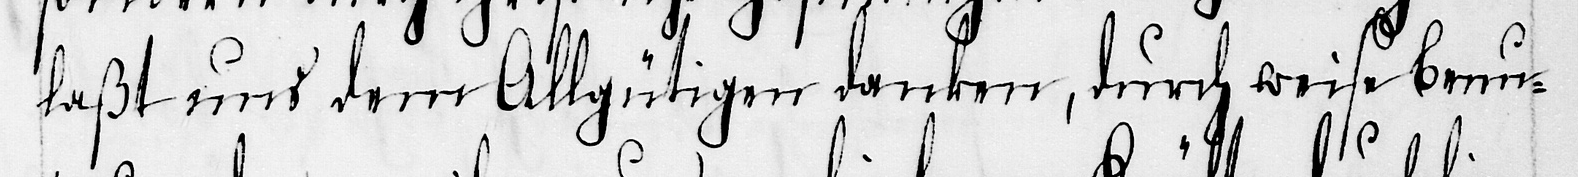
laßt uns dem Allgütigen danken, durch weise Benu¬
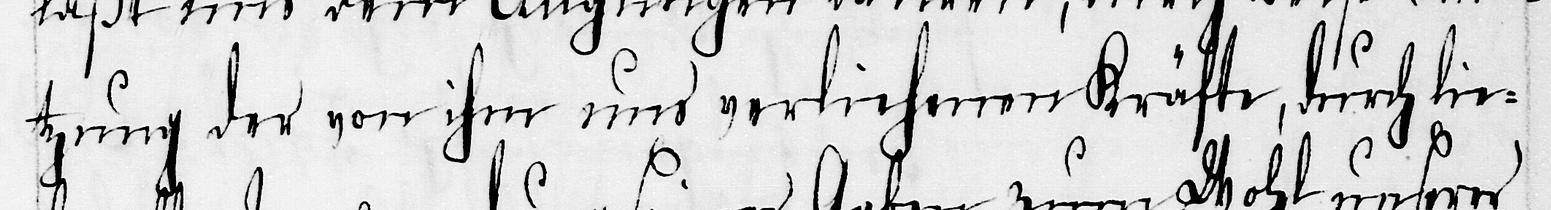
tzung der von ihm uns verliehenen Kräfte, durch lie¬
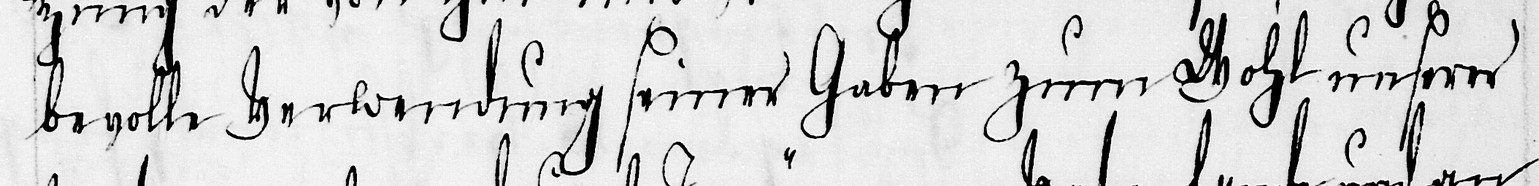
bevolle Verwendung seiner Gaben zum Wohl unserer
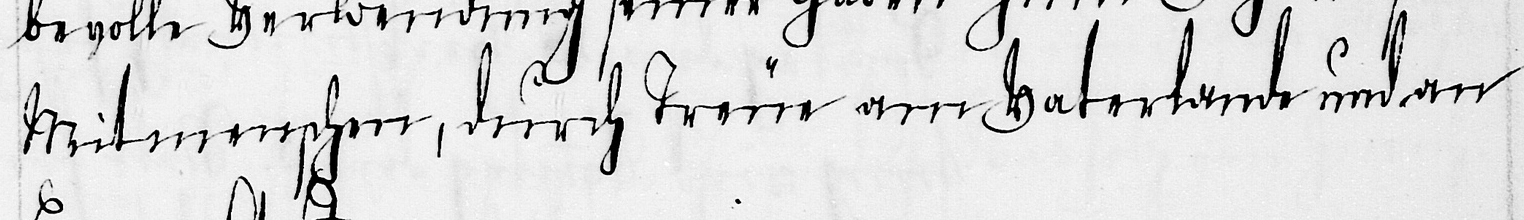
Mitmenschen, durch Treue am Vaterlande und an
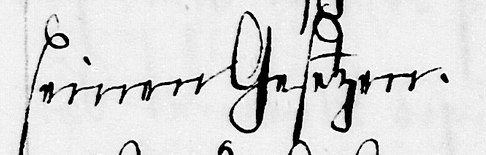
seinen Gesetzen.
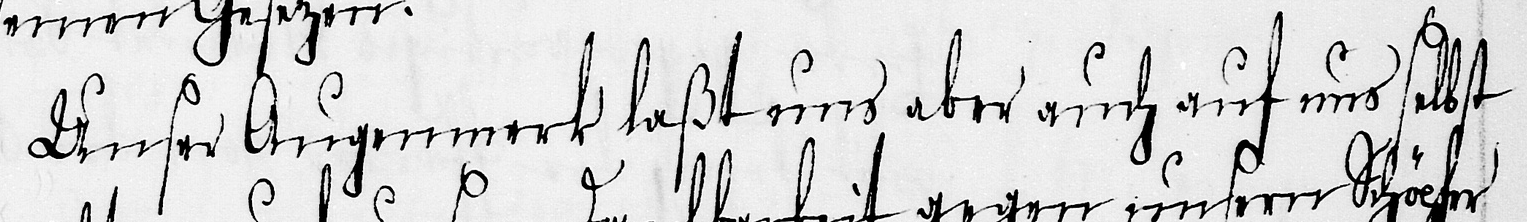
Unser Augenmerk laßt uns aber auch auf uns selbst
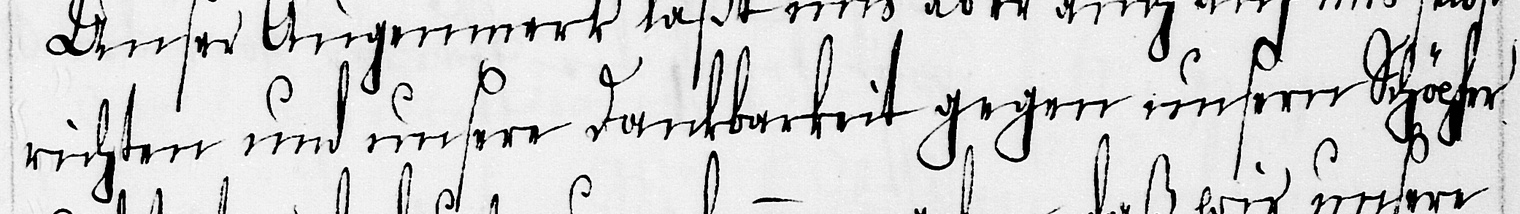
richten und unsere Dankbarkeit gegen unsern Schöpfer
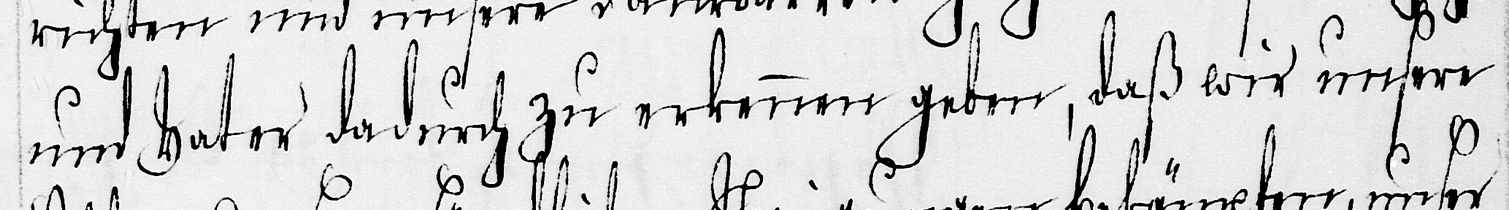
und Vater dadurch zu erkennen geben, daß wir unsere
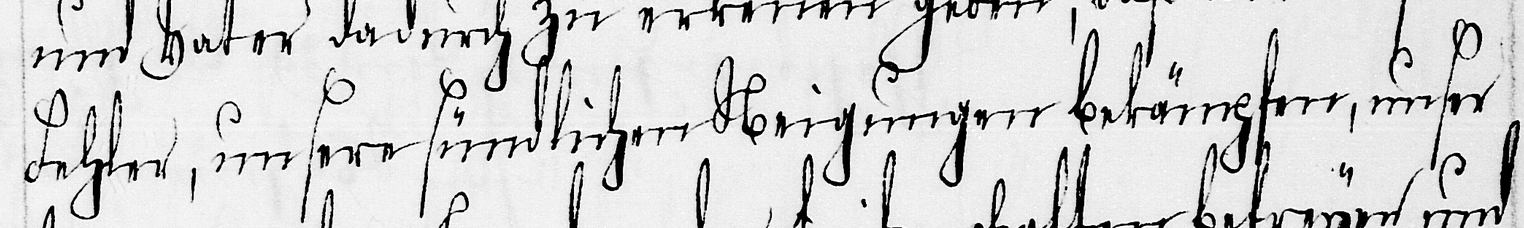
Fehler, unsere sündlichen Neigungen bekämpfen, unser
